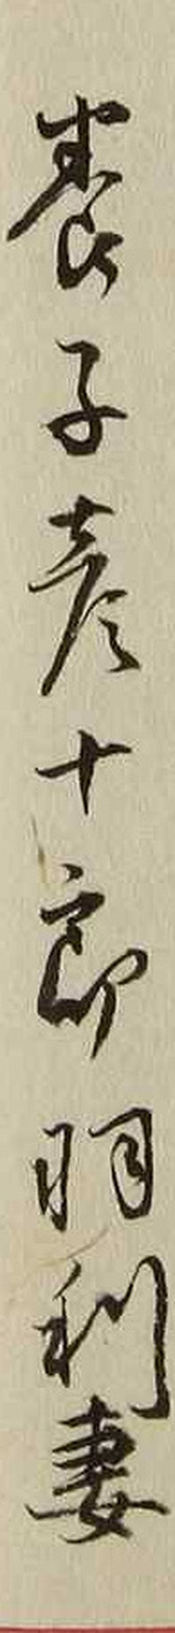女養子彦十郎羽利妻
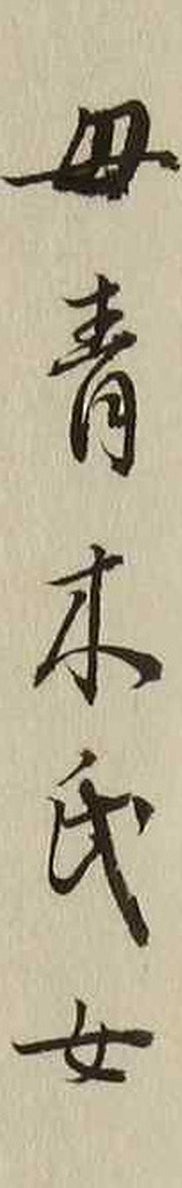母青木氏女
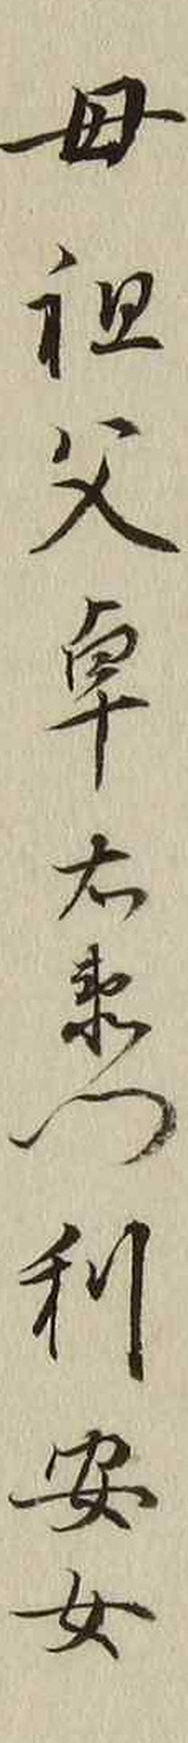母祖父卓右衛門利安女
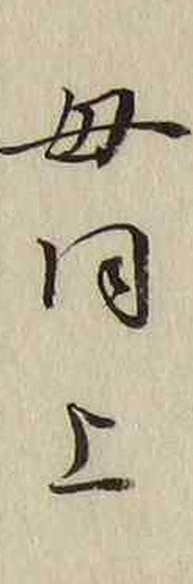母同上

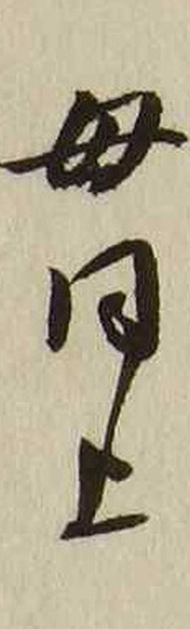母同上
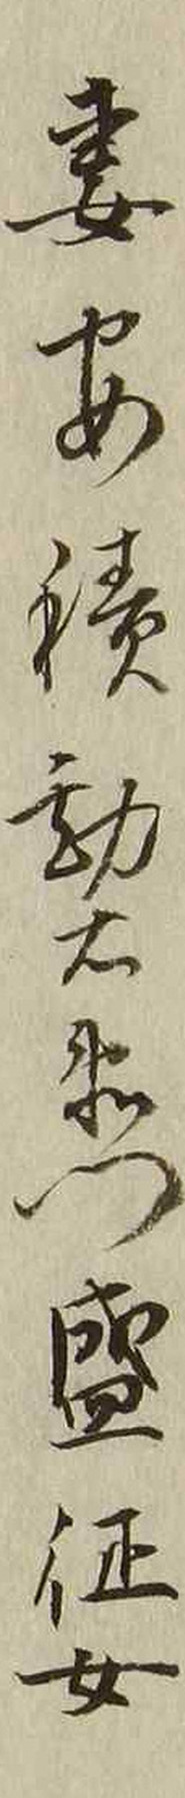妻安積勘右衛門盛征女
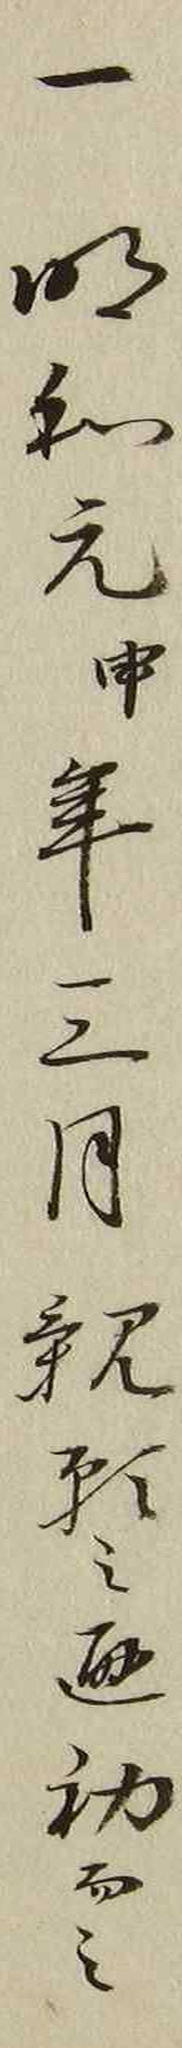一明和元申年三月親願之通初而之
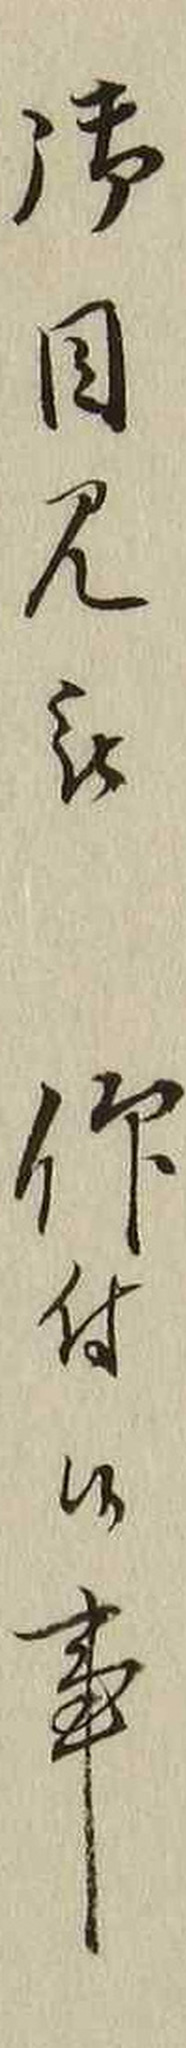御目見被仰付候事
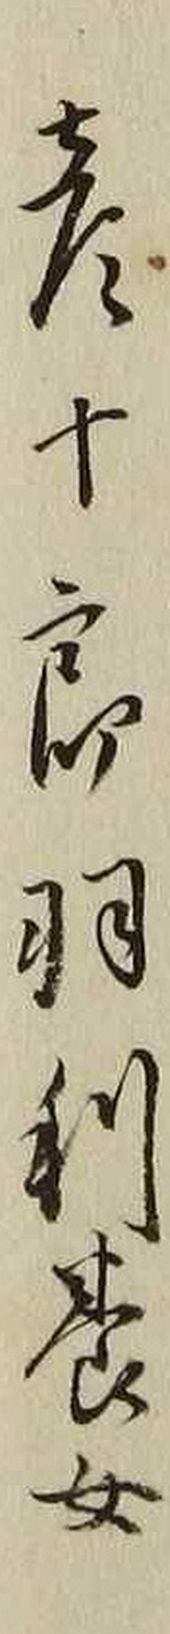女彦十節羽利養女
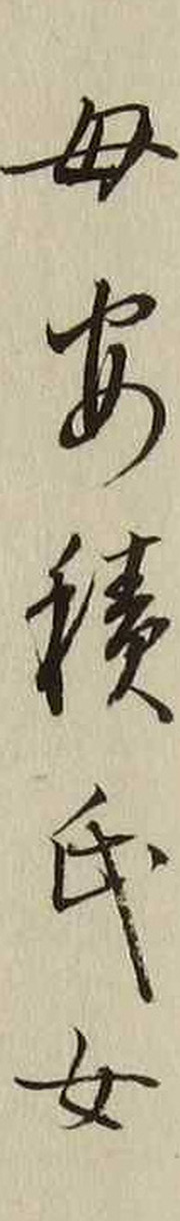母安積氏女
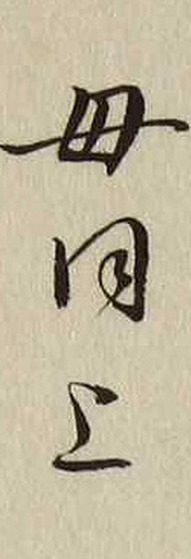母同上
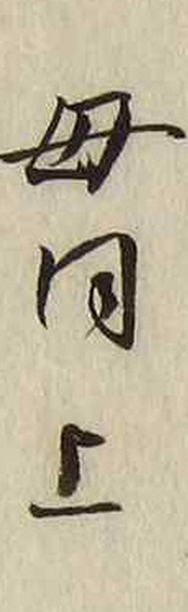母同上

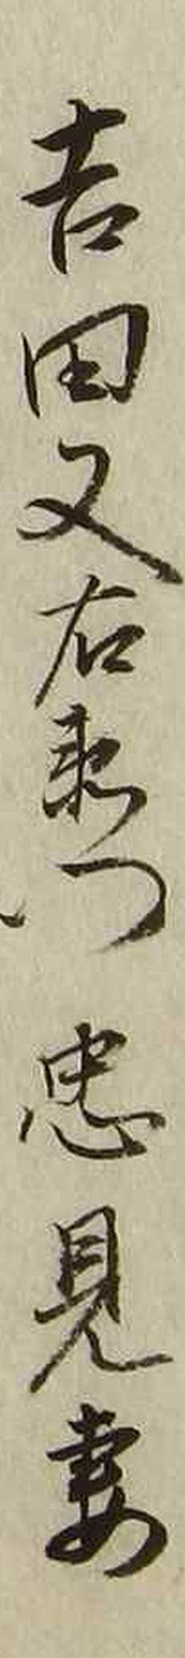吉田又右衛門忠見妻
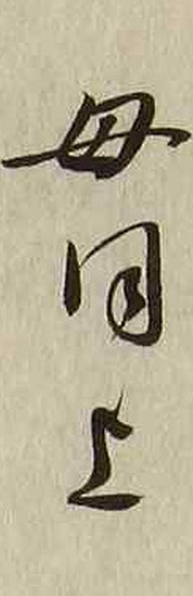母同上
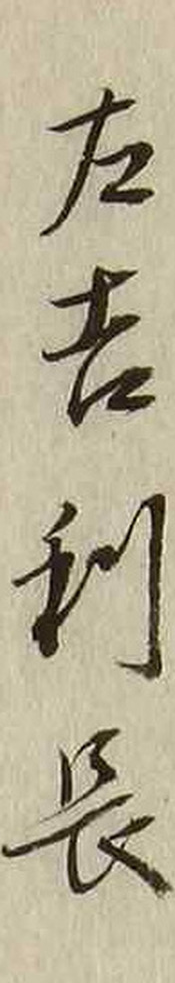左吉利長
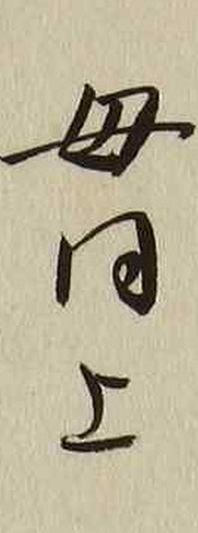母同上
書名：諸士系譜　巻之22　い之部22
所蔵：会津若松市立会津図書館
